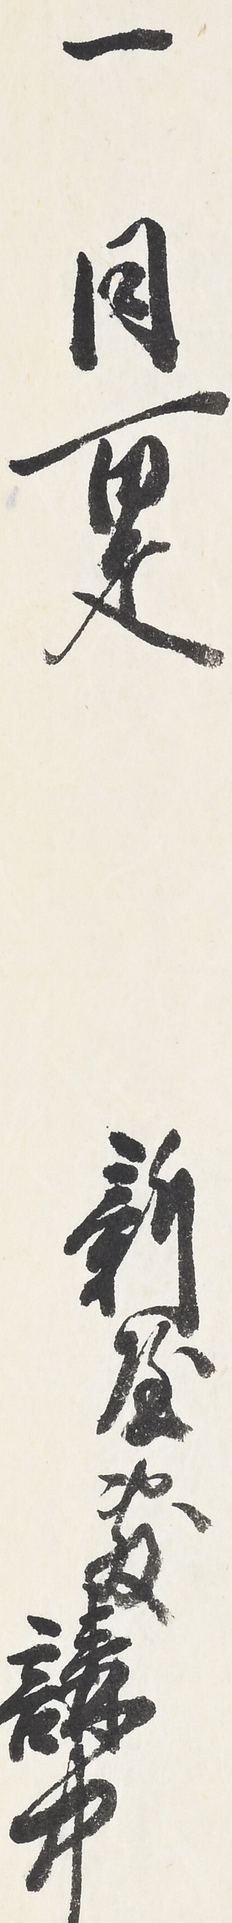一同百疋新屋敷講中

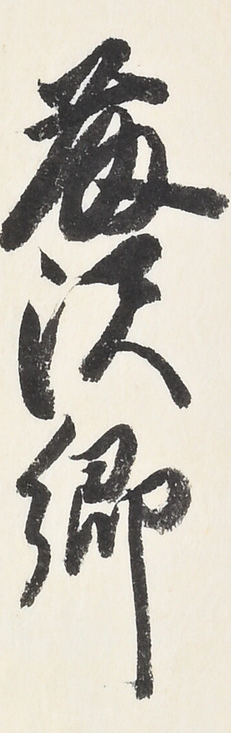藤沢郷
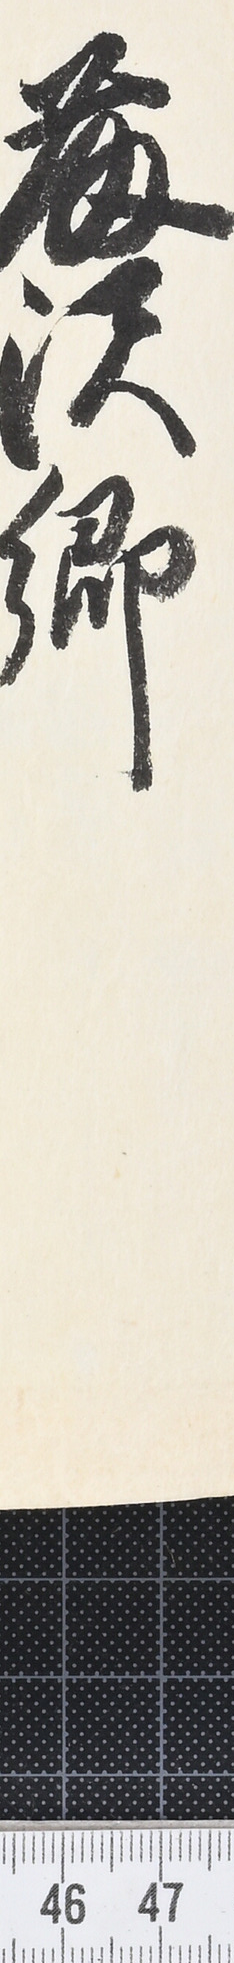藤沢郷
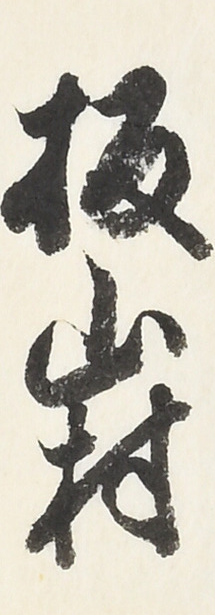板山村
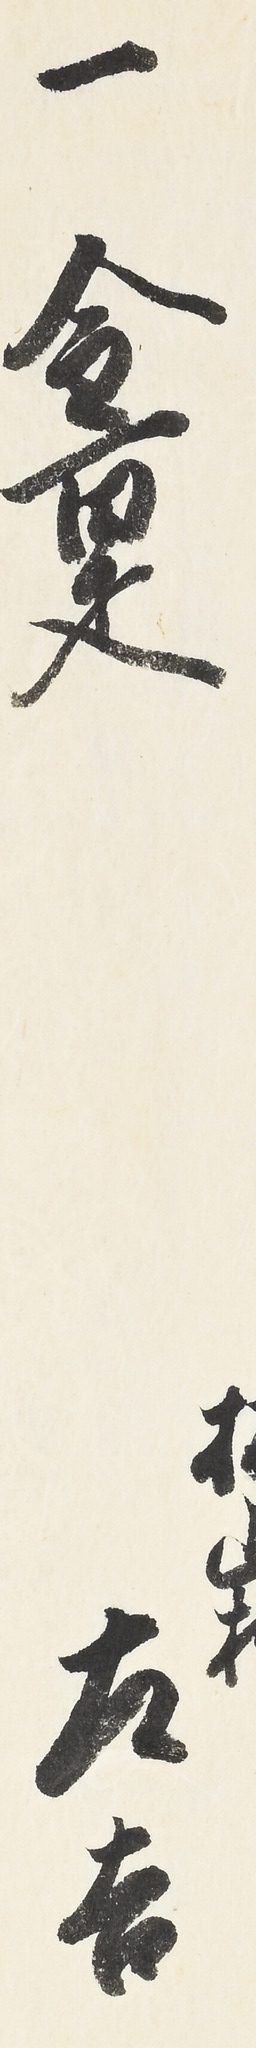一金百疋左吉

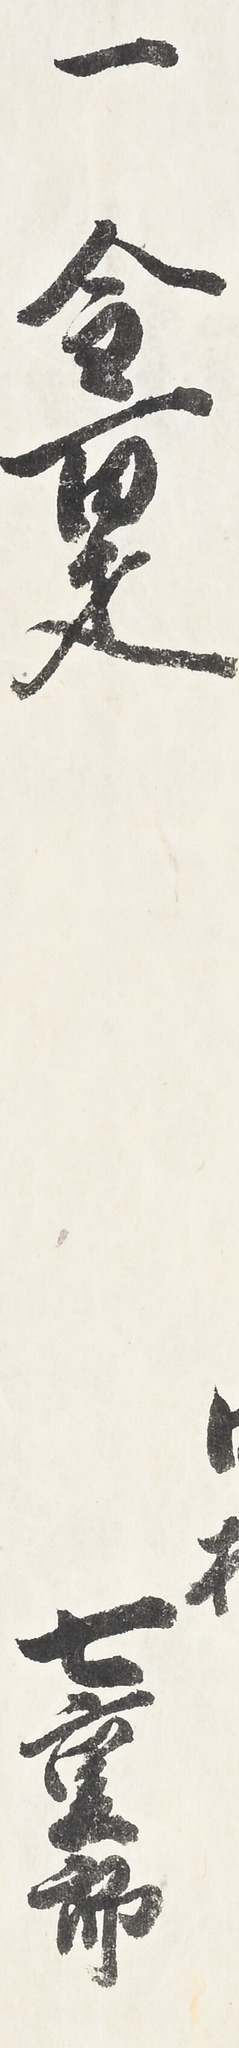一金百疋七重郎
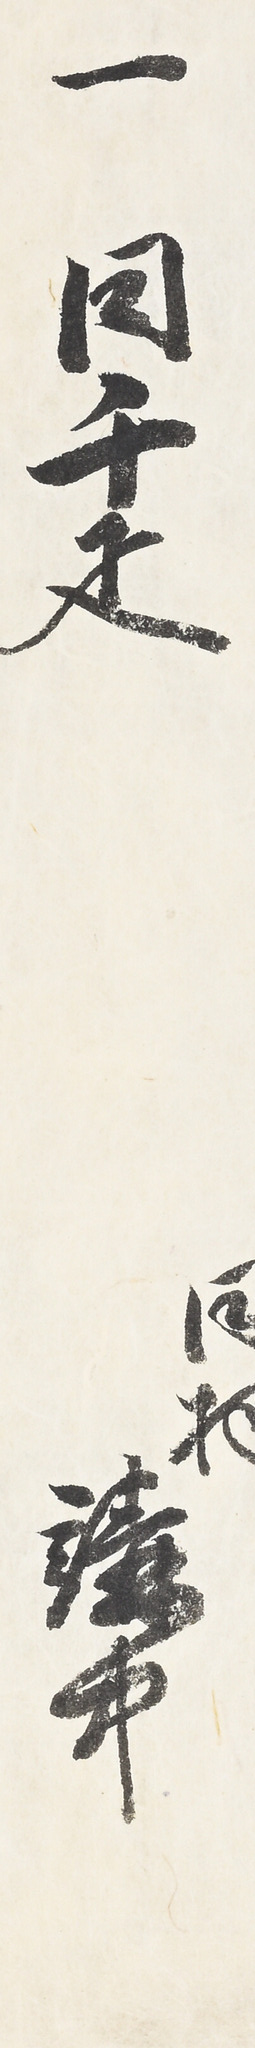一同千疋講中
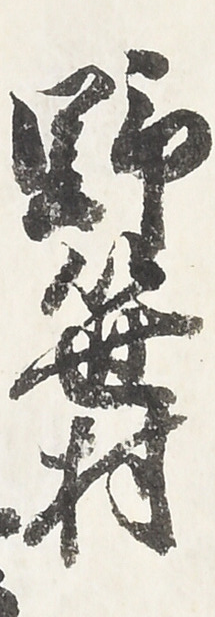野笹村
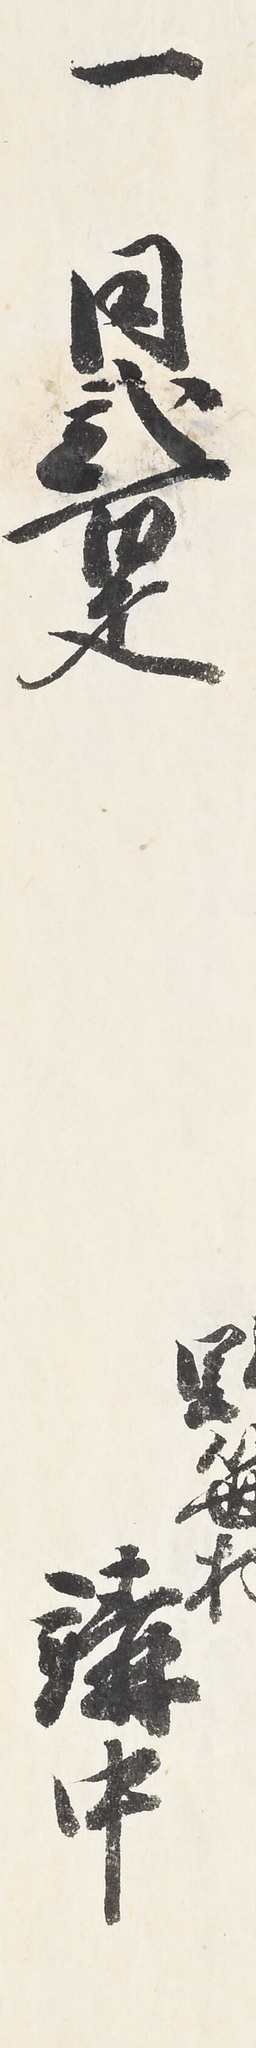一同弐百疋講中
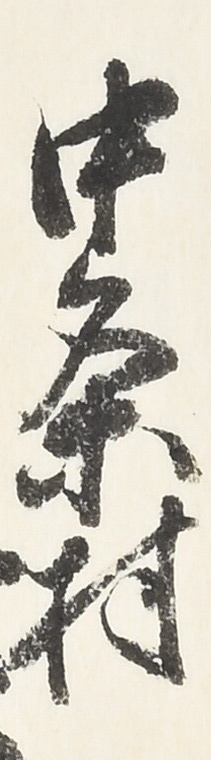中条村
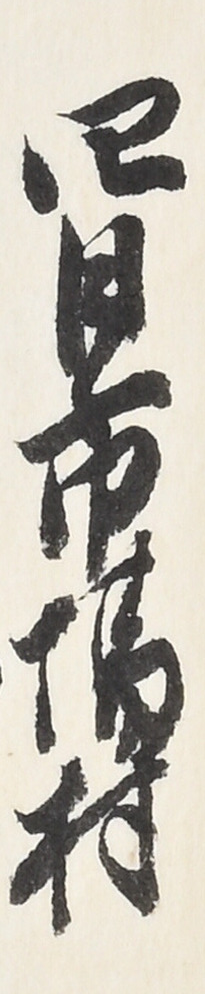四日市場村
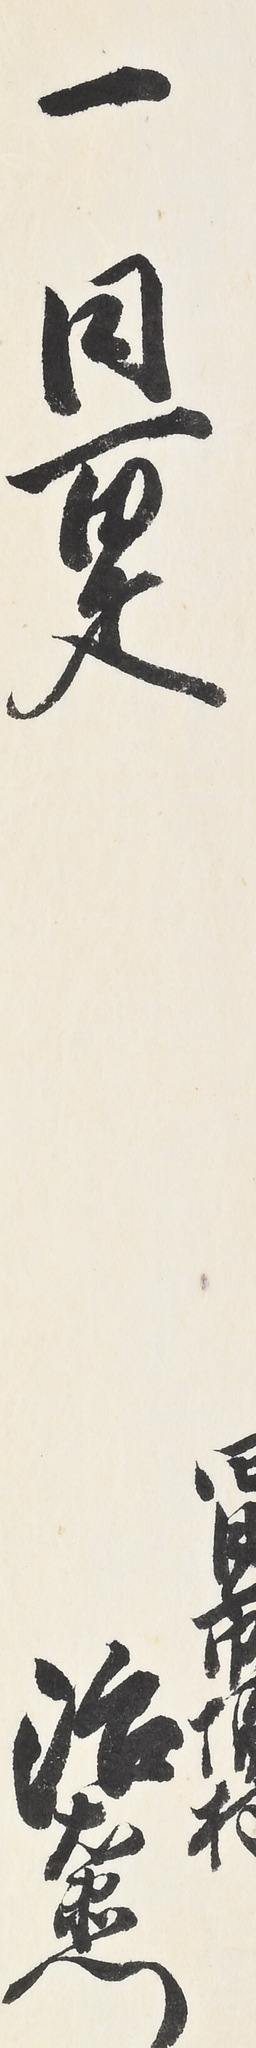一同百疋治右衛門
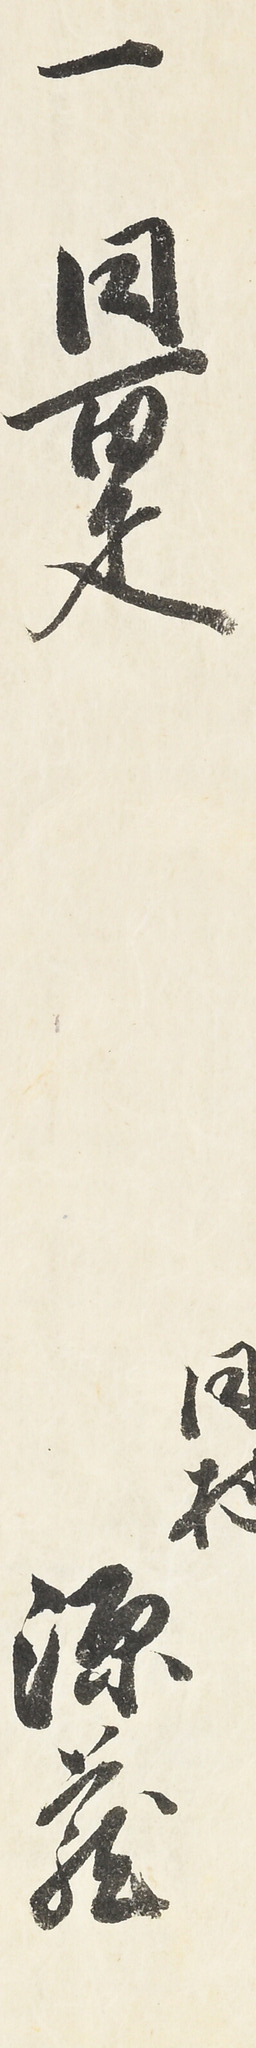一同百疋源蔵

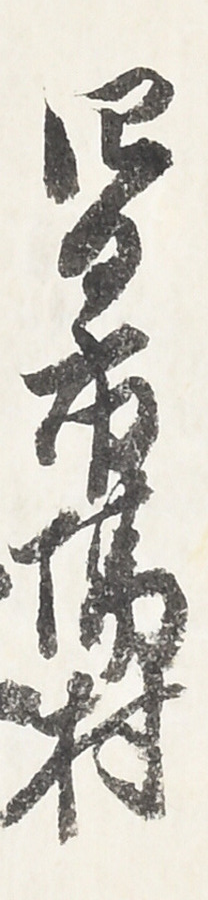四日市場村
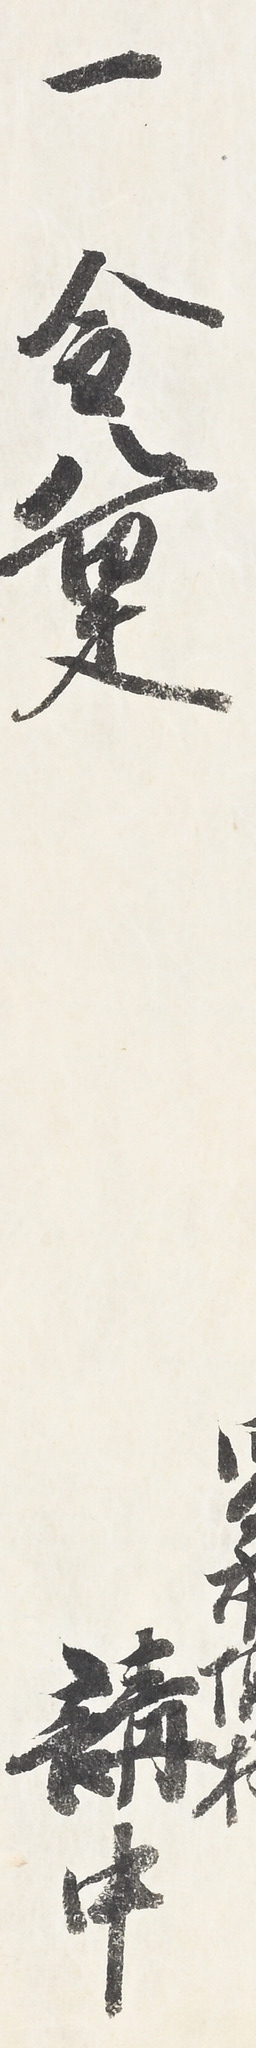一金八百疋講中
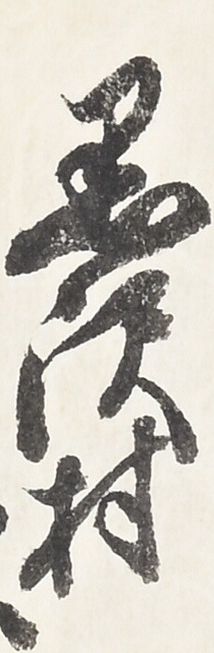黒沢村
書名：永代太々御神楽名前帳
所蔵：伊那市立高遠町図書館・合同会社AMANE
